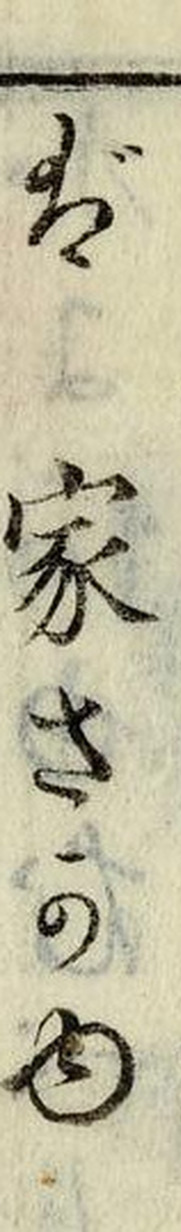ば家さかゆ
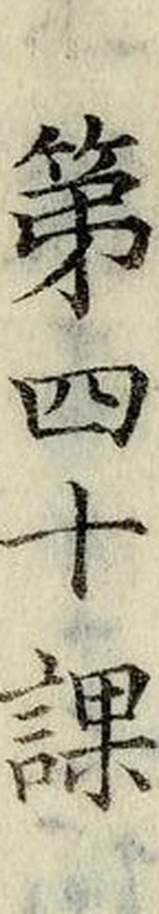第四十課
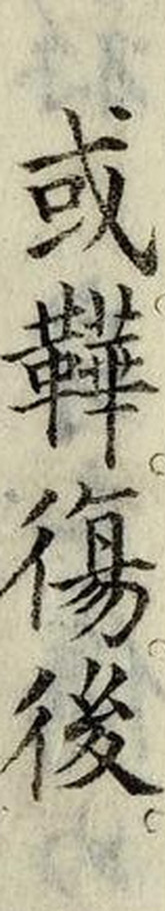或。鞾。。後。
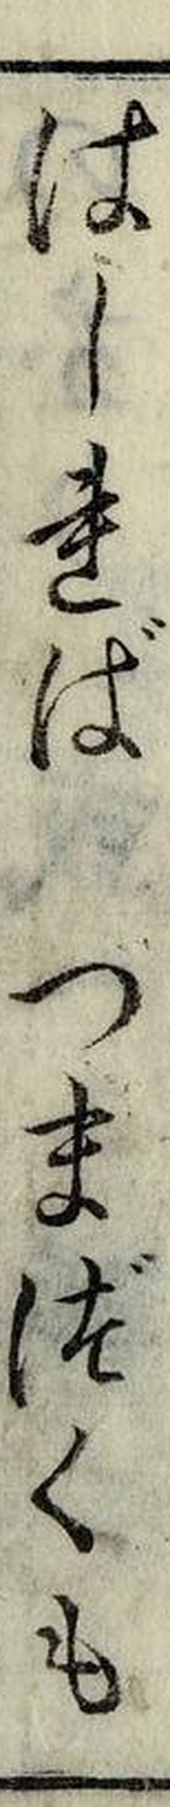はしればつまづくも

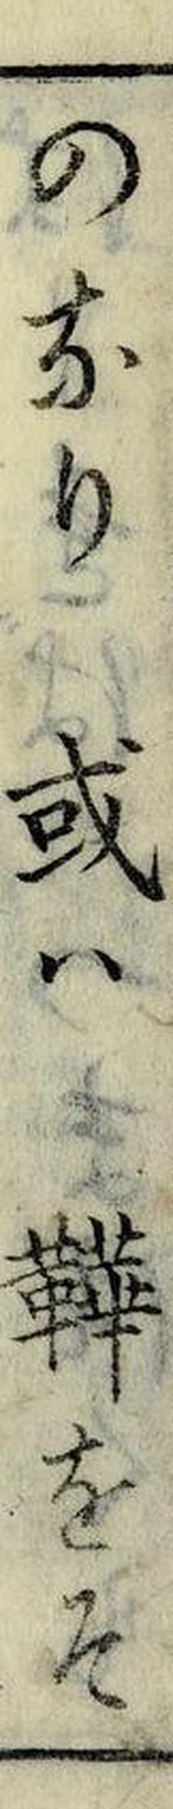のなり或は鞾をそ
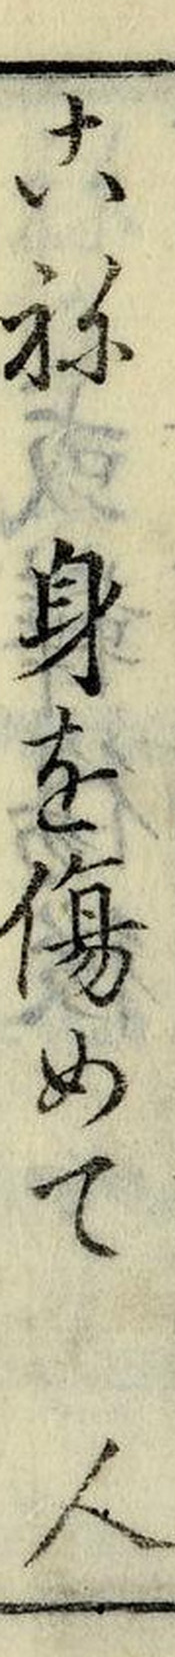こね身を傷めて人
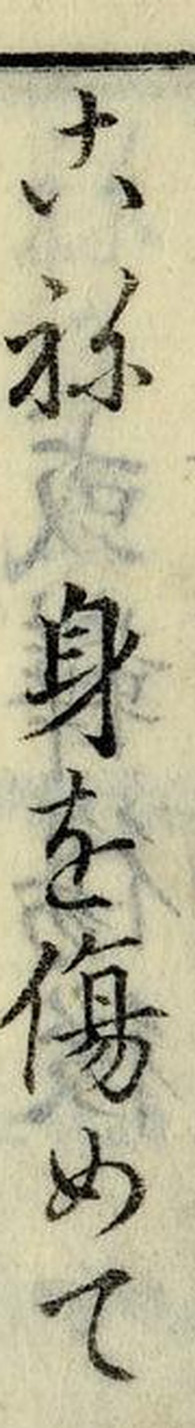こね身を傷めて人
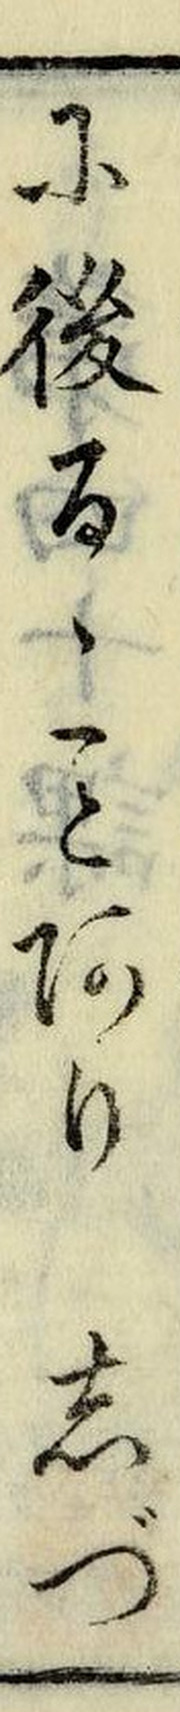に後るゝことありしづ
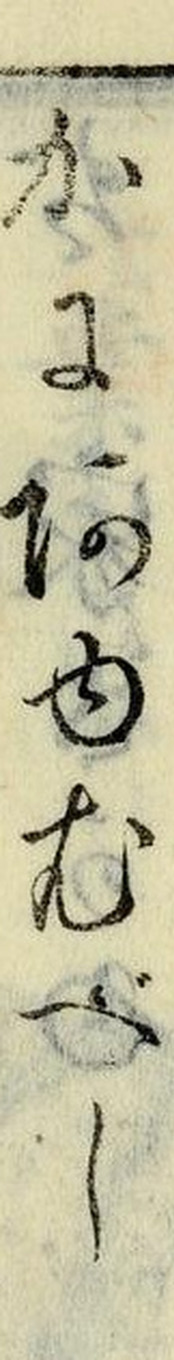かにあゆむべし
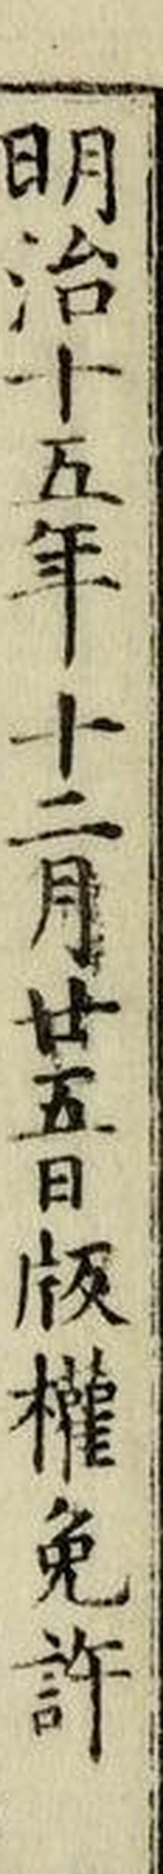明治十五年十二月廿五日版権免許
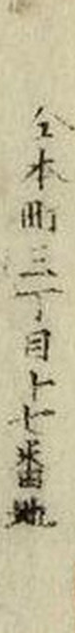同本町三丁目十七番地

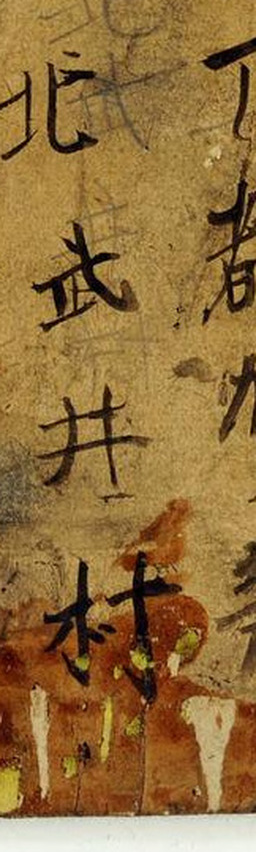北武井村
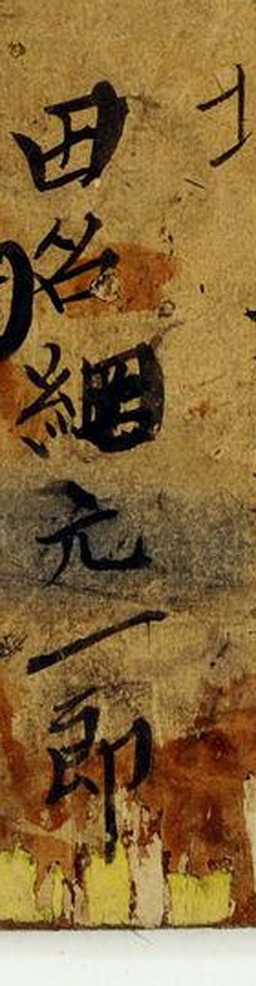田名細元一郎
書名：小学読本 初等科 巻一
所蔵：福井県文書館 Fukui Prefectural Archives
